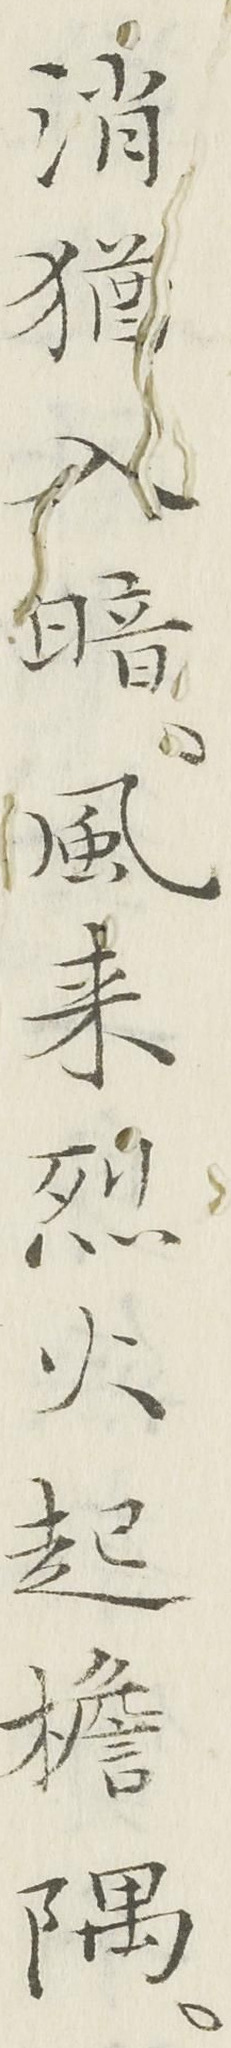消猶入暗風来烈火起檐隅
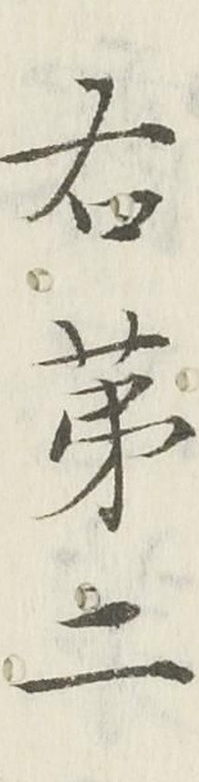右第二
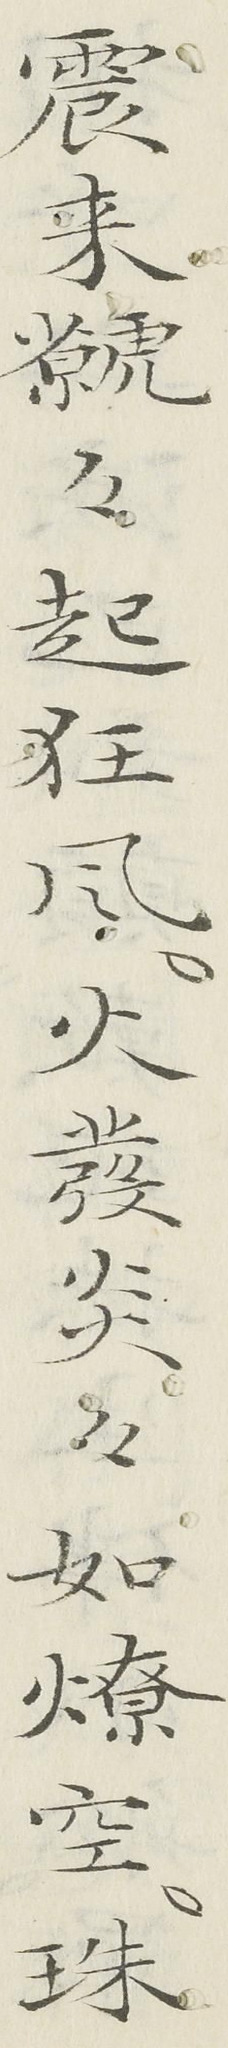震来虩々起狂風火発炎々如燎空珠
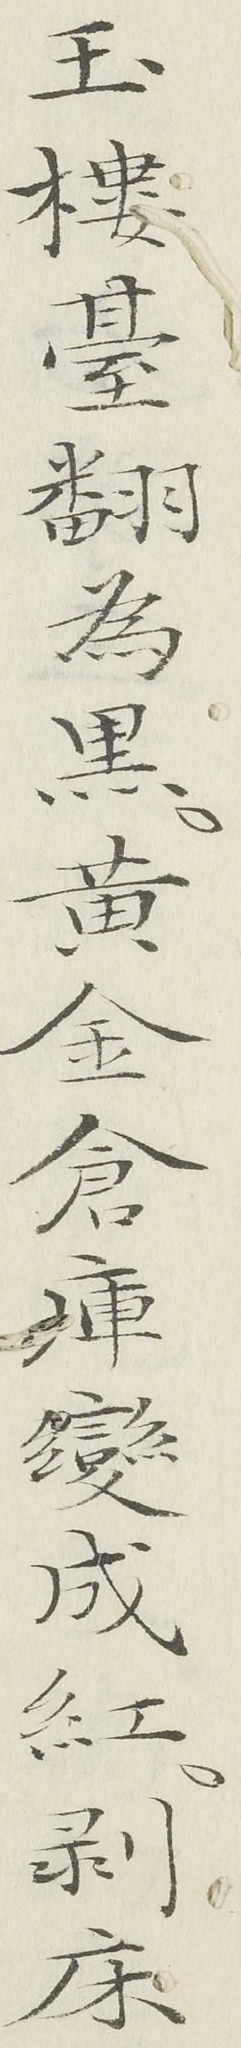玉楼台翻為黒黄金倉庫変成剝床
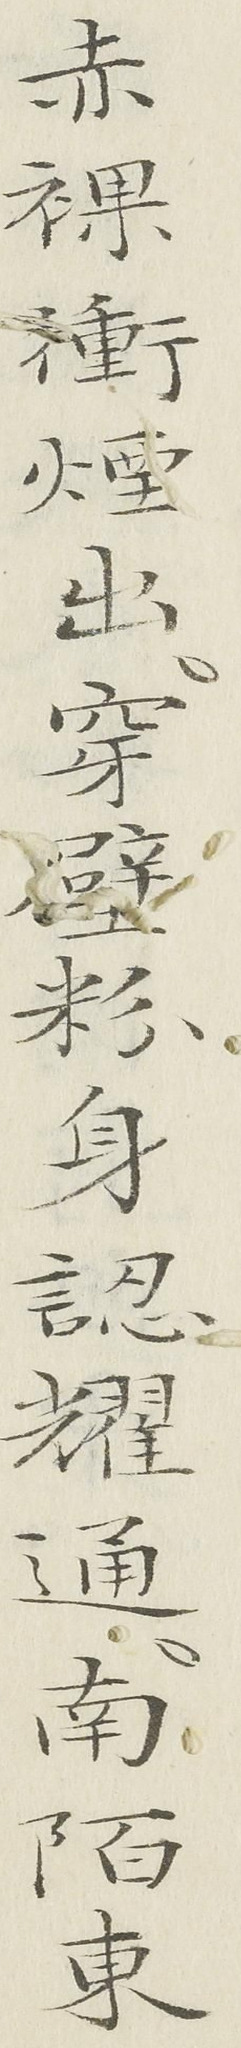赤裸衝煙出穿壁粉身認耀通南陌東

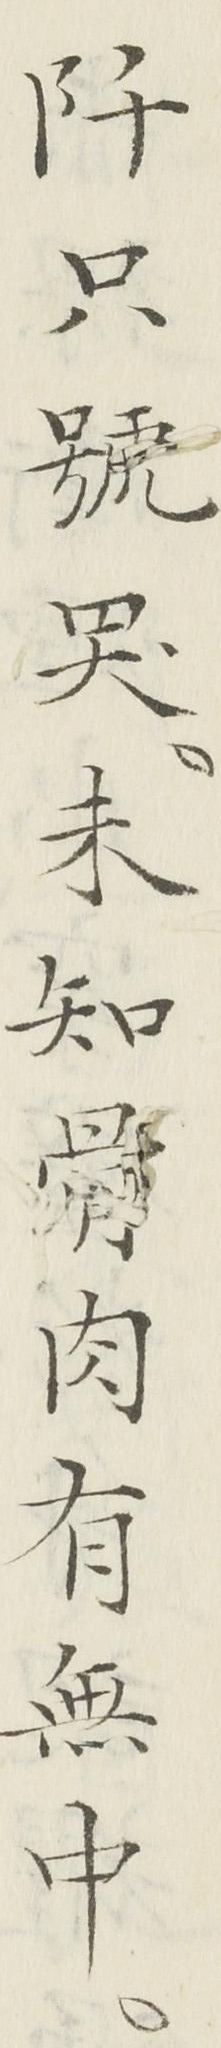阡只号哭未知骨肉有無中
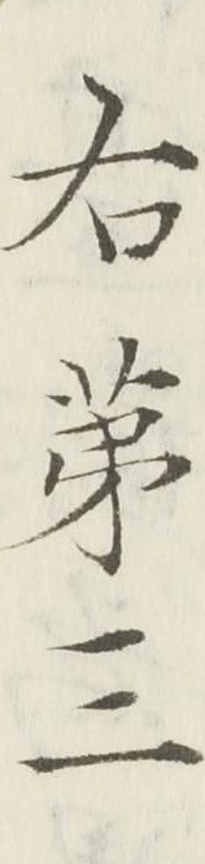右第三
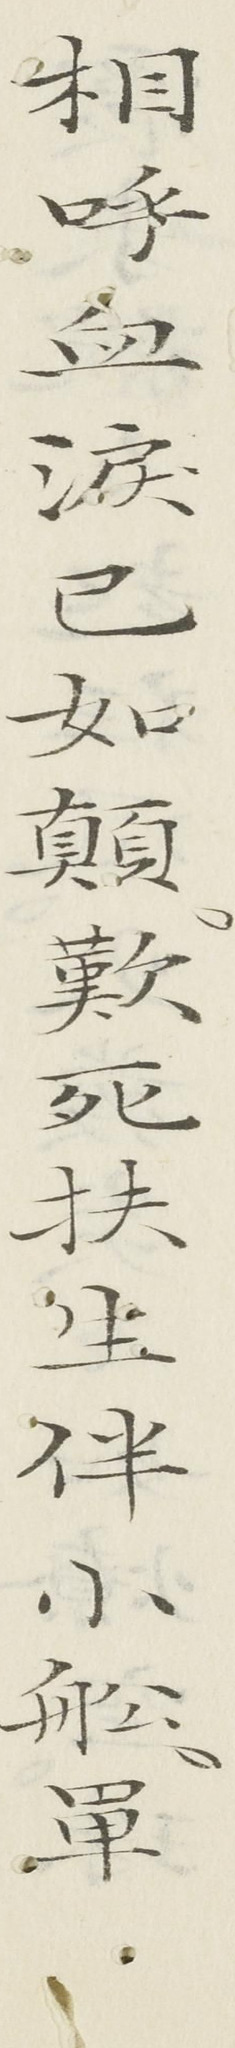相呼血涙己如顛歎死扶生伴小舩単
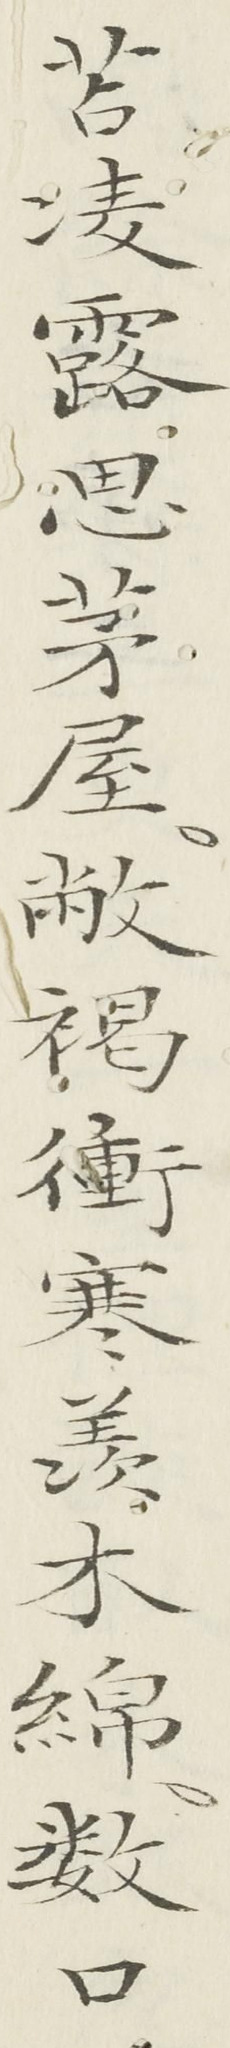苫凌露思茅屋敝褐衝寒羨木綿数口
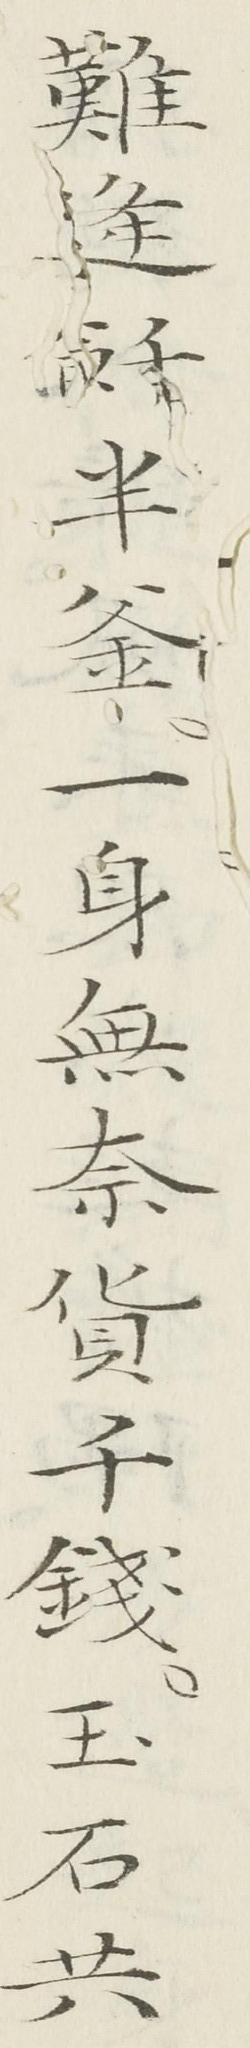難逢飦半釜一身無奈貨千銭玉石共
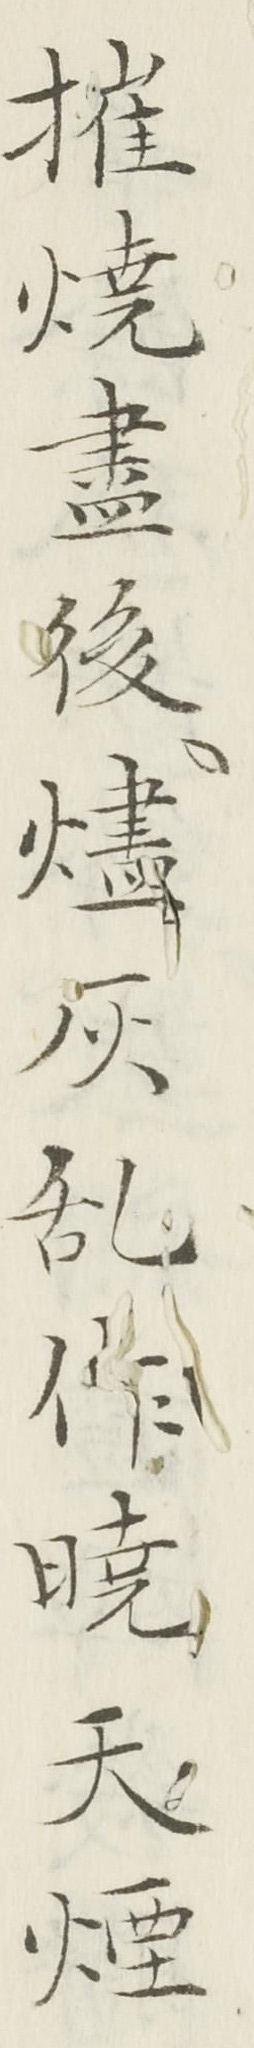摧焼尽後燼灰乱作暁天煙
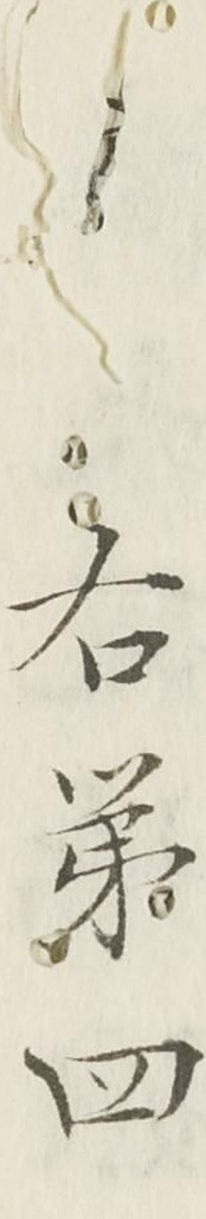右第四
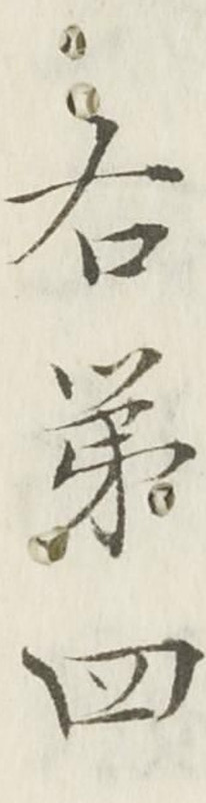右第四
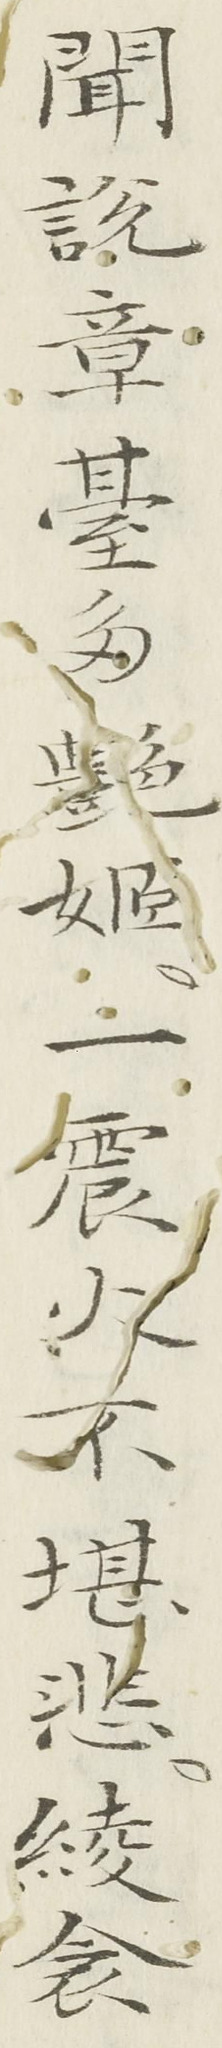聞説章台多艶姫一震火不堪悲綾衾
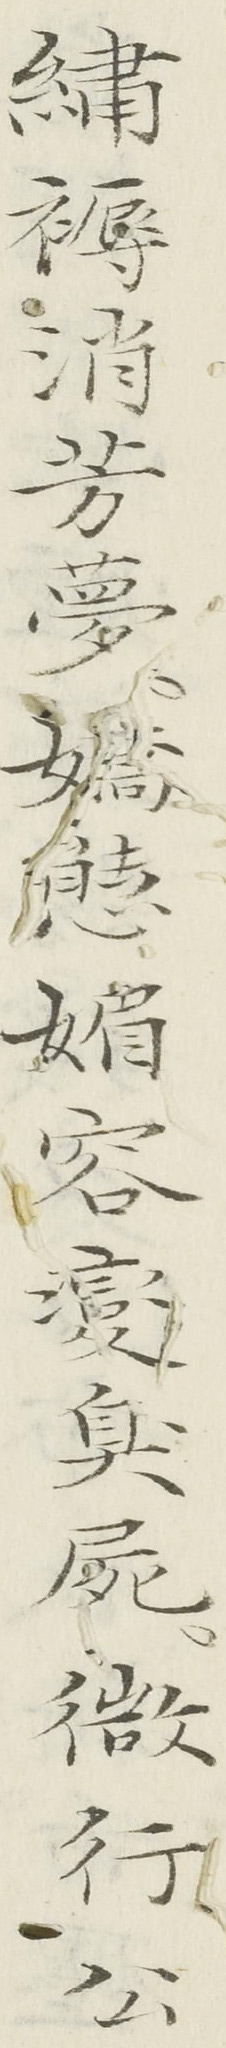繍褥消芳夢嬌態媚容変臭屍微行公
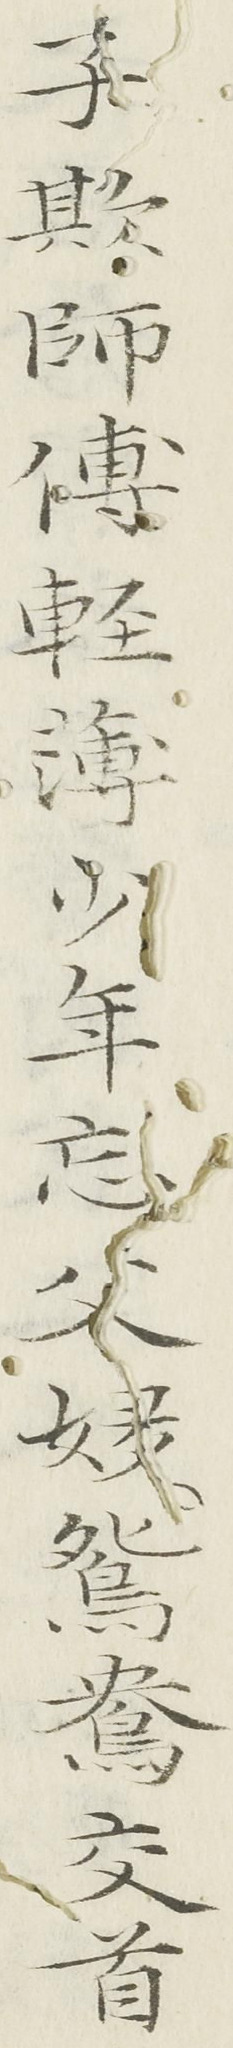子欺師伝軽薄少年忘父婦？鴛鴦交首
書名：地震考證　全
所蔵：東京大学地震研究所図書室 Earthquake Research Institute Library, The University of Tokyo, JAPAN
